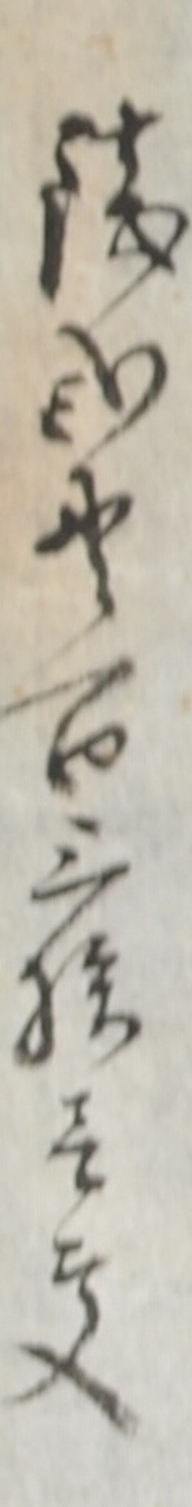銭弐貫百三拾壱文
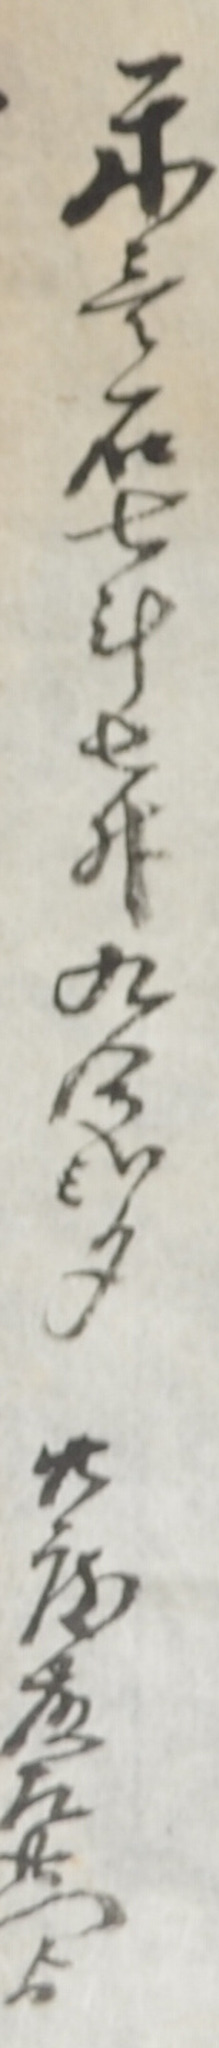米壱石七斗七升九合弐勺此度藤左衛門ゟ
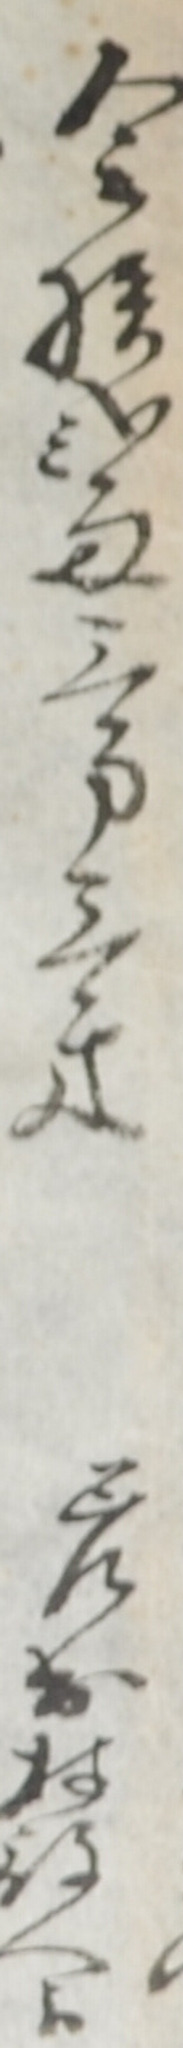金拾弐両三分三朱差出村役人江
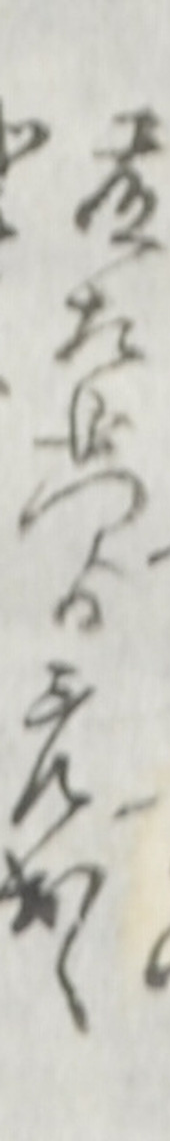藤左衛門ゟ差出候
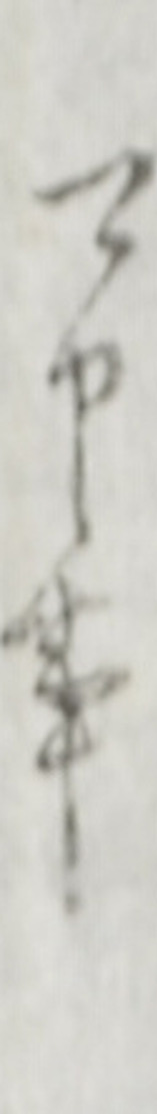可申渡
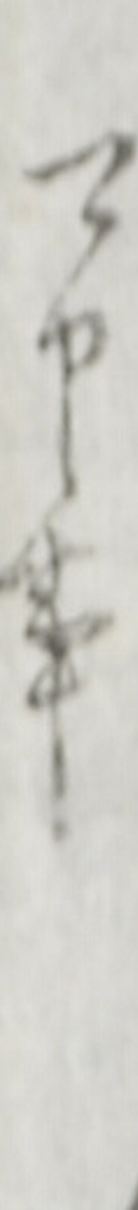可申渡
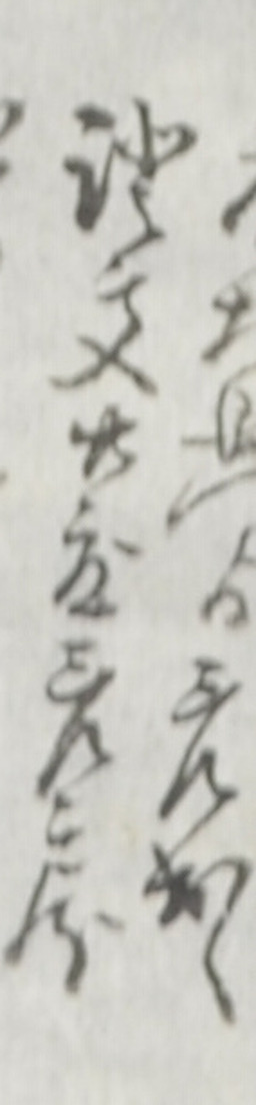証文此度差戻
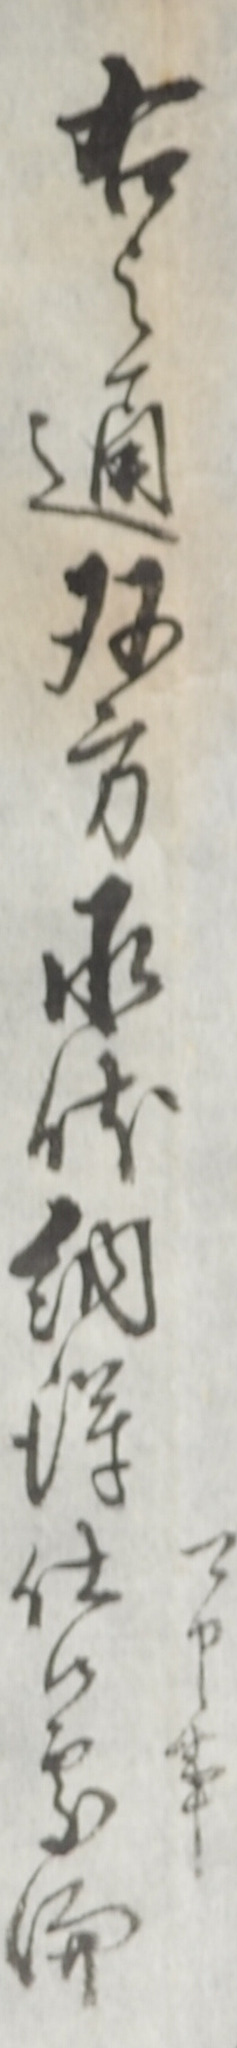右之通双方承伏納得仕候処偏
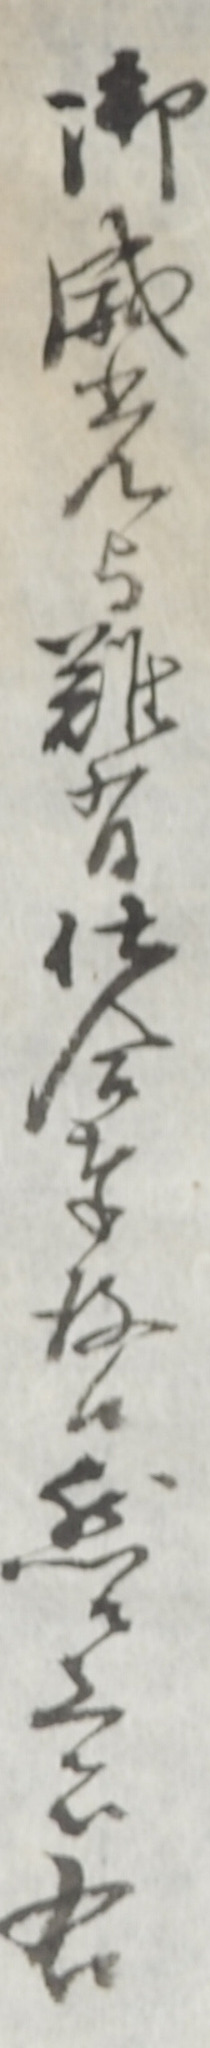御威光与難有仕合奉存候然ル上者右
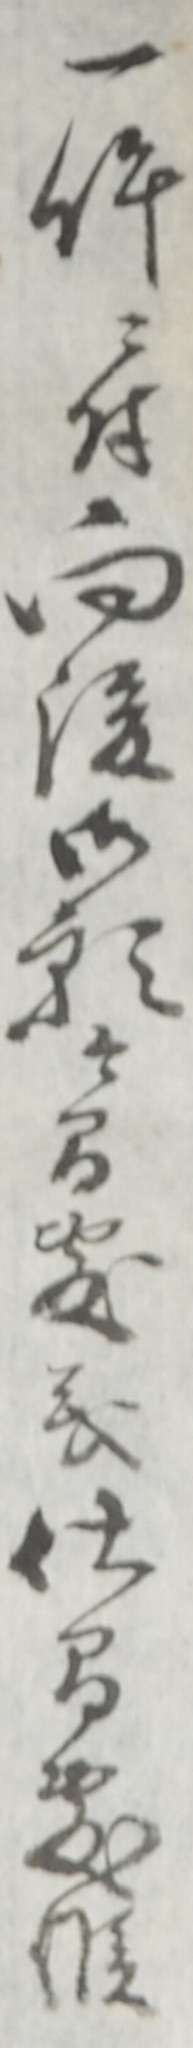一件ニ付向後御願ヶ間敷義仕間敷候
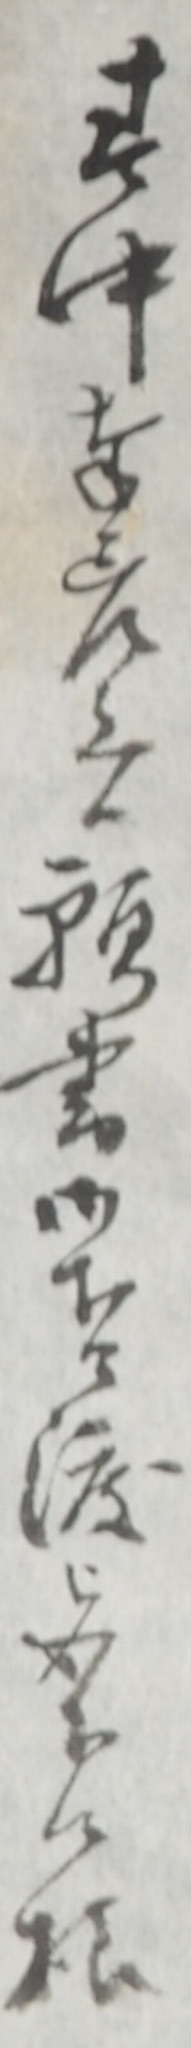春中奉差上候願書御下ヶ渡被成下候様
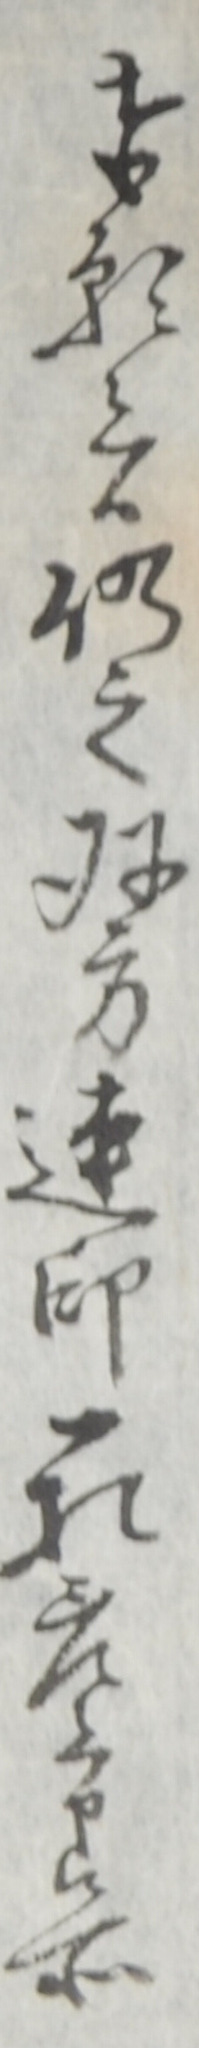奉願上候仍之双方連印一札差上申候所
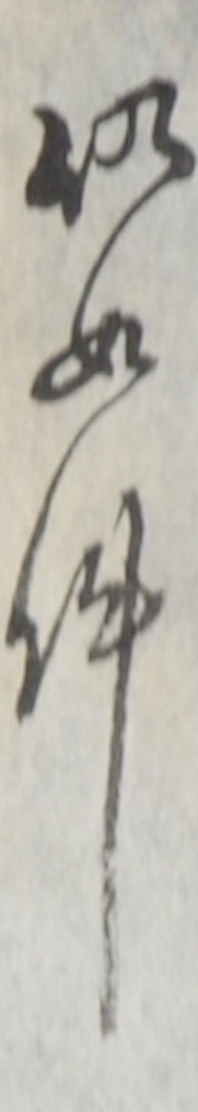仍如件

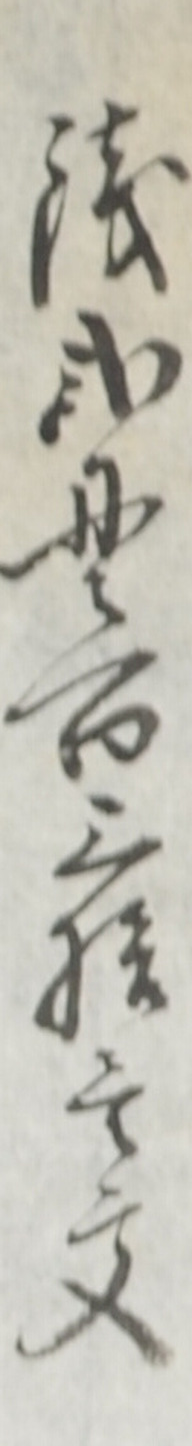銭弐貫百三拾壱文
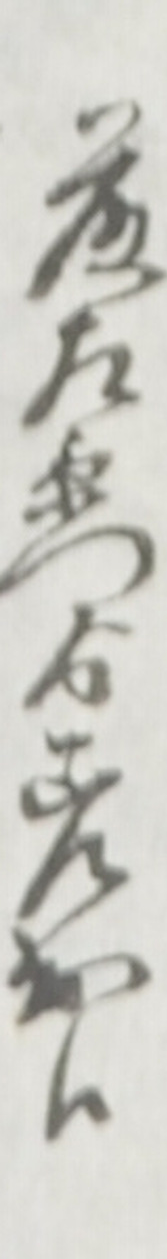藤左衛門ゟ差出候
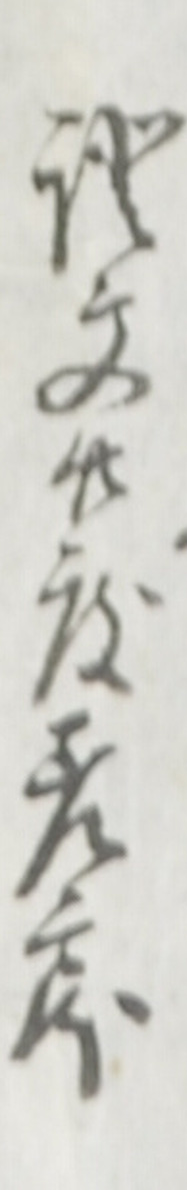証文此度差戻
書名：（済口証文断簡）
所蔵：伊那市立高遠町図書館・合同会社AMANE
